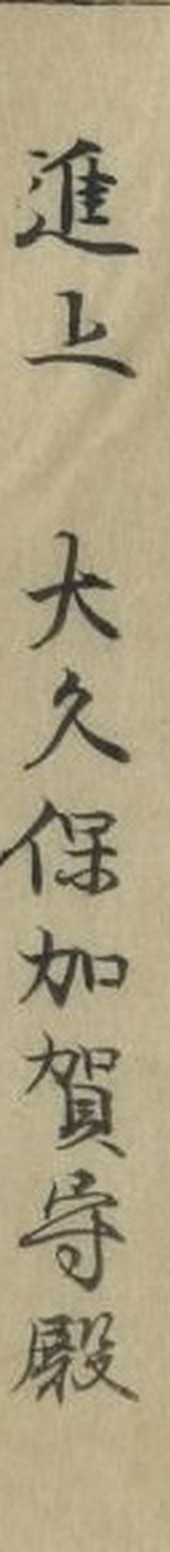進上大久保加賀守殿
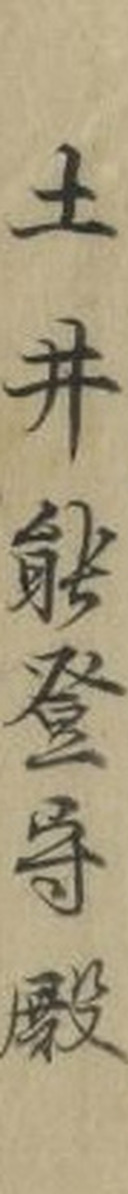土井能登守殿

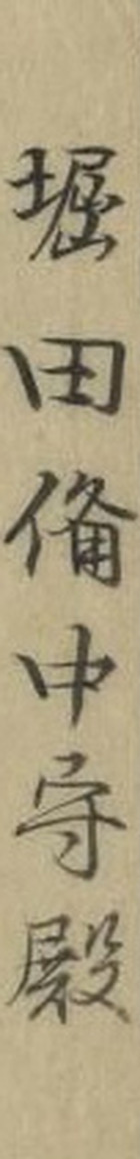堀田備中守殿
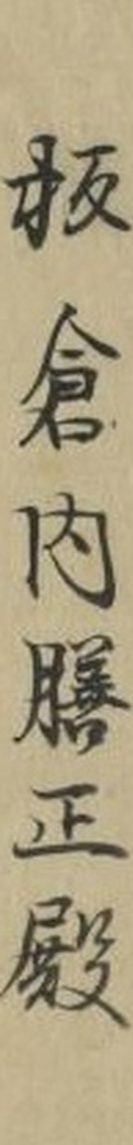板倉内膳正殿
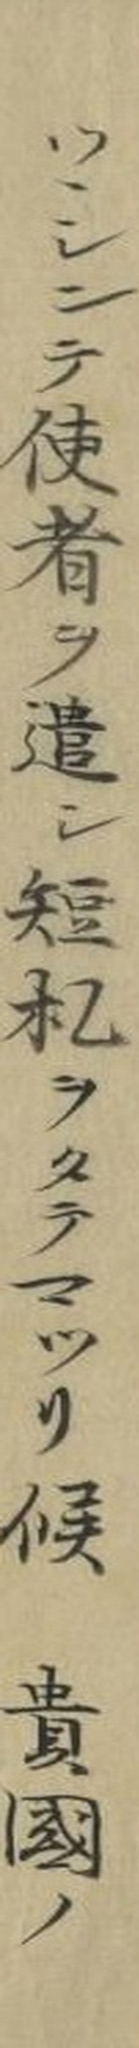ツ丶シンテ使者ヲ遣シ短札ヲタテマツリ候貴国ノ
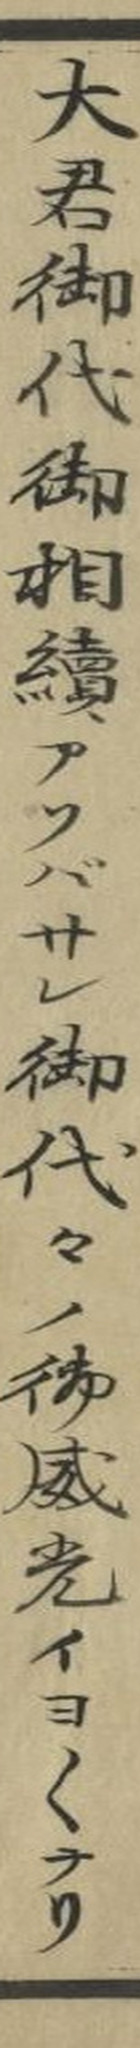大君御世相続アソバサレ御代々ノ御威光イヨ〳〵ナリ
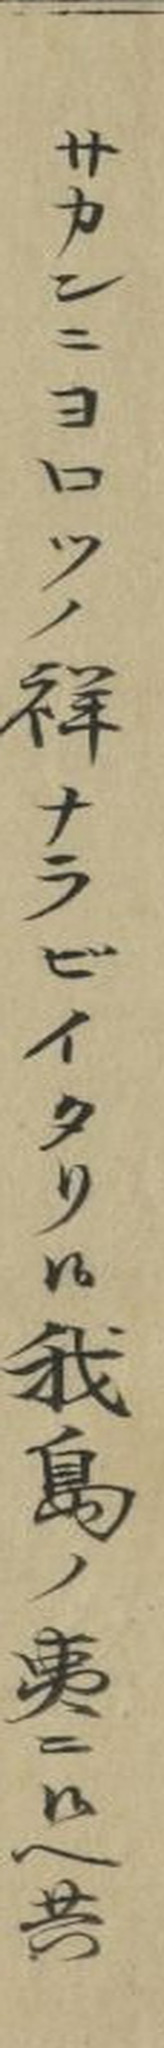サカン二ヨロツノ祥ナラビイタリ候我島ノ夷ニ候へ
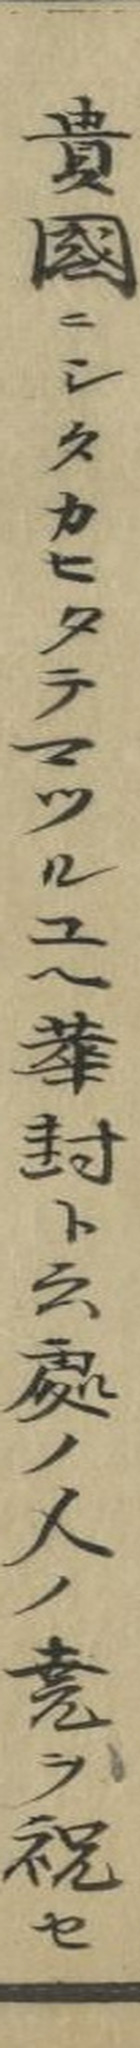貴国ニシタカヒタテマツルユへ華封ト云処ノ人ノ尭ヲ祝セ
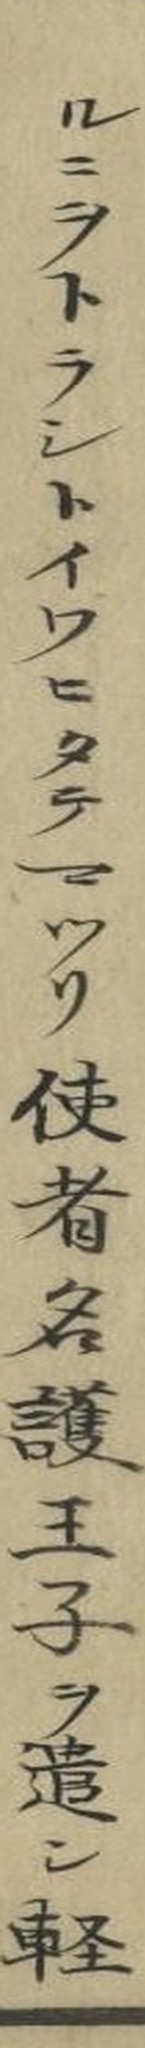ルニヲトラシトイワヒタテマツリ使者名護王子ヲ遣シ軽
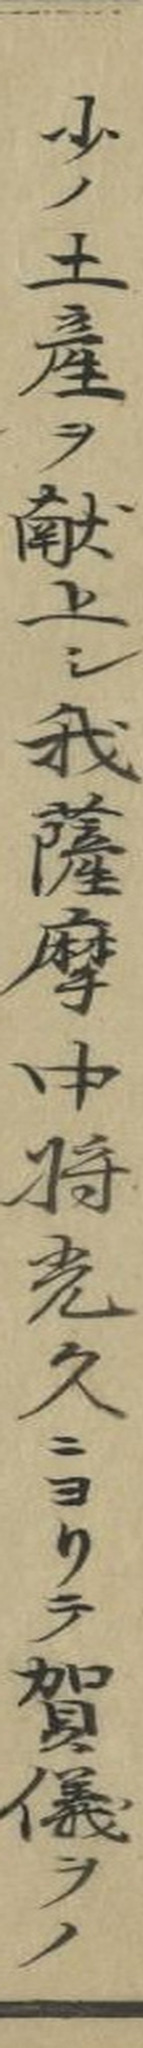少ノ土産ヲ献上シ我薩摩中将光久ニヨリテ賀儀ヲノ
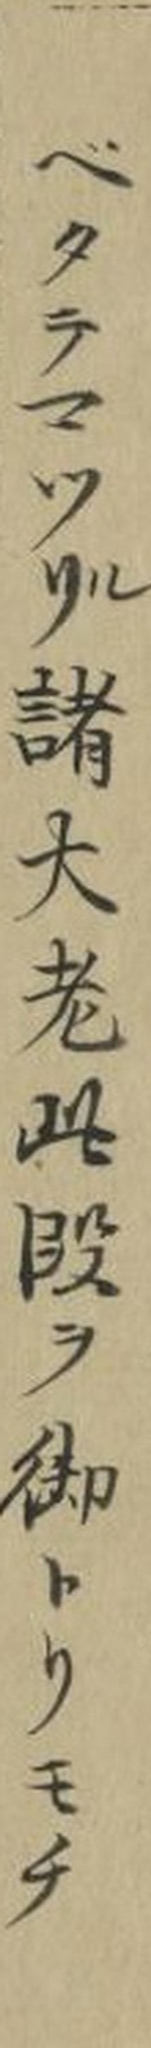ベタテマツリ諸大老此段ヲ御トリモチ
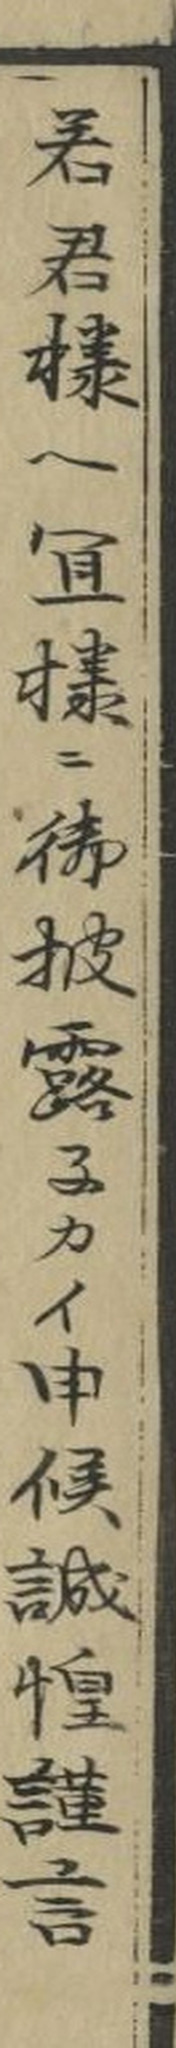若君様へ宜様ニ御披露ネカイ申候誠惶謹言
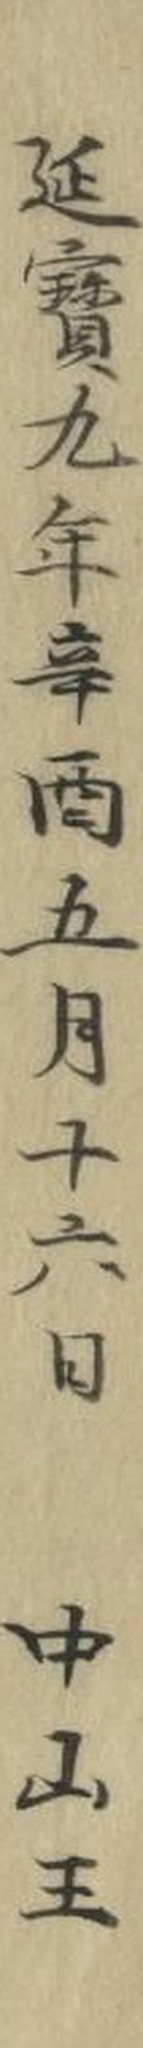延宝九年辛酉五月十六日中山王
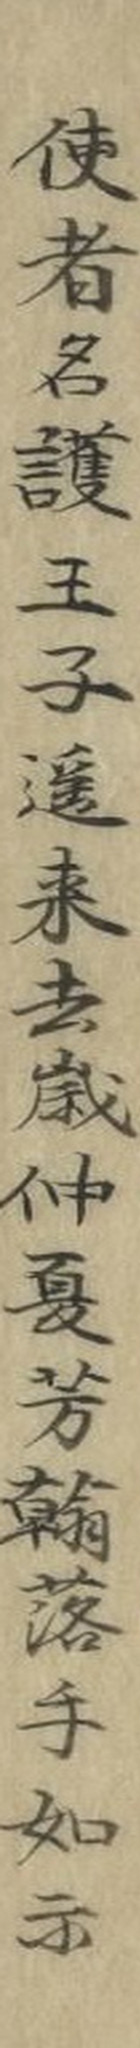使者名護王子遥来去歳仲夏芳翰落手如示
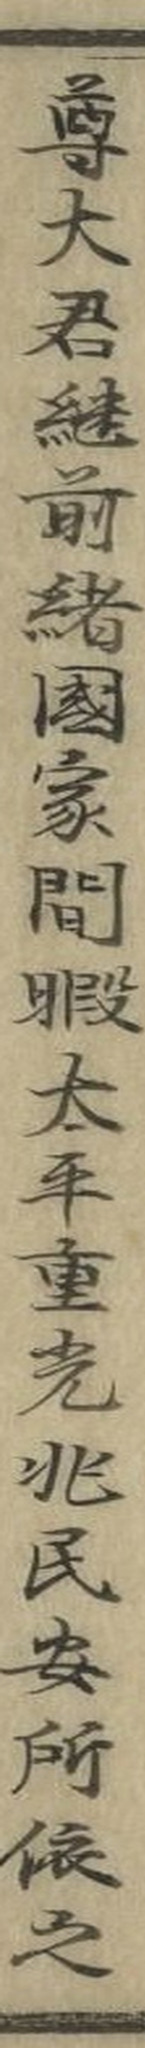尊大君継前諸国家間暇太平重光兆民安所依之
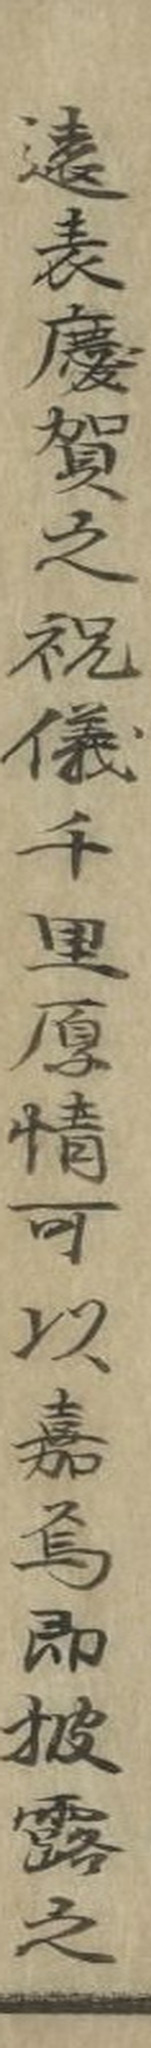遠表慶賀之祝儀千里厚情可以焉即披露之
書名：琉球往来（下）
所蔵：University of the Ryukyus Library
